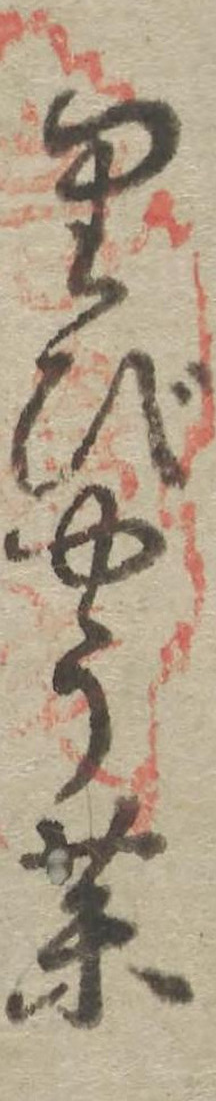りびやう薬
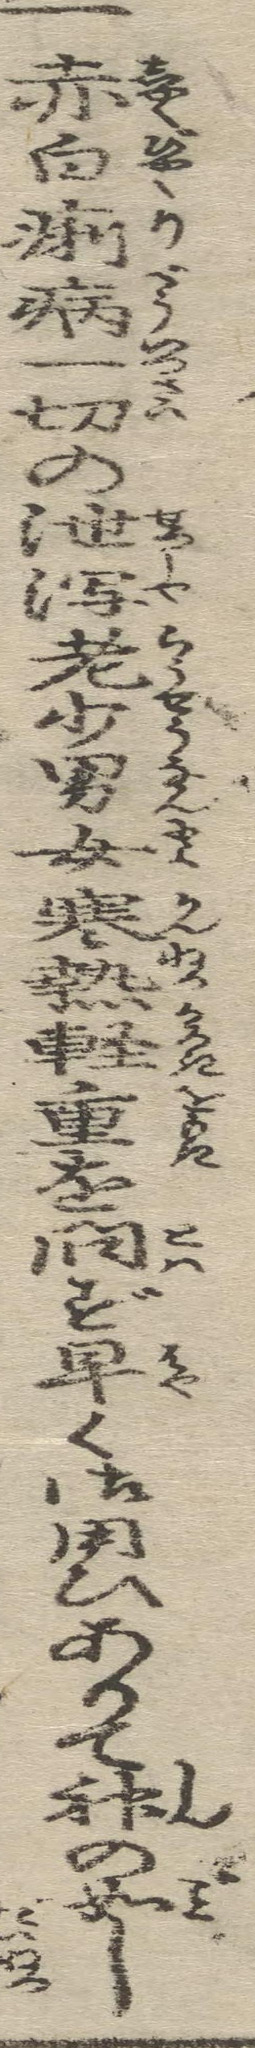一赤白痢病一切の泄瀉老少男女寒熱軽重を問ず早く御用ひありて神の如し
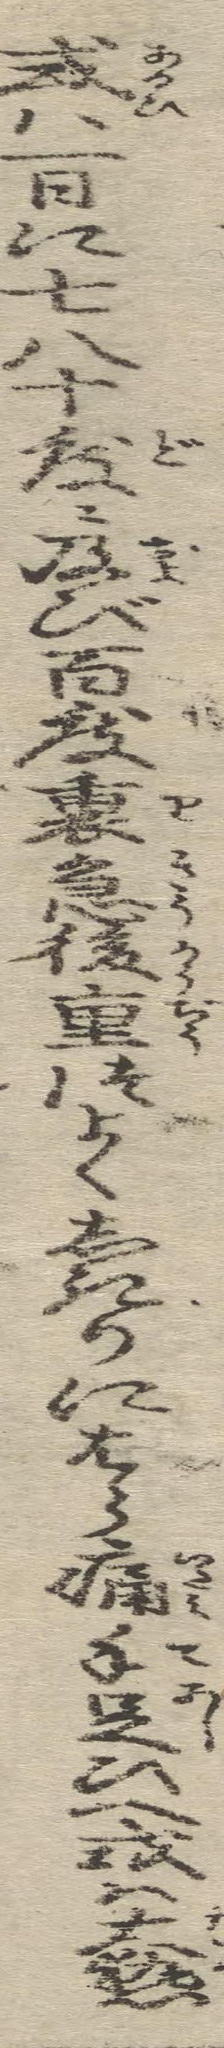或は一日に七八十度に及び百度裏急後重つよくしきりにはら痛手足ひへ或は大熱
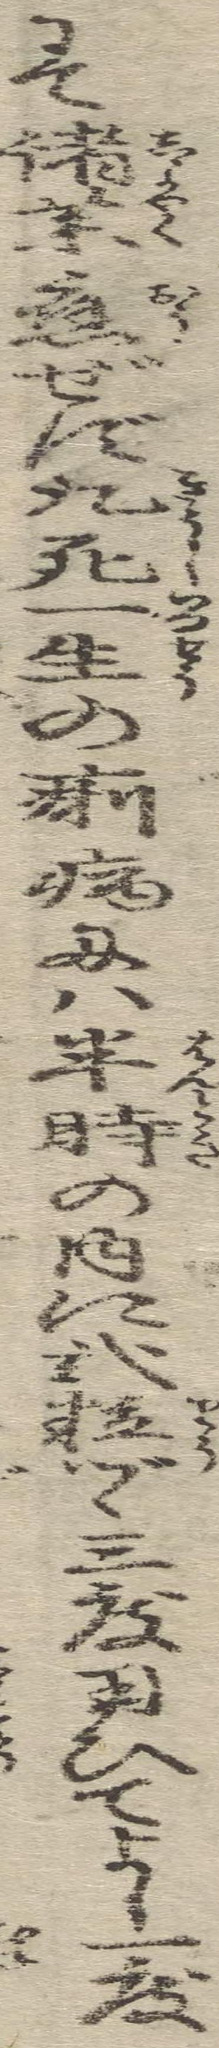にて諸薬応ぜず九死一生の痢病には半時の内に弐粒づゝ三度用ひてよし一度
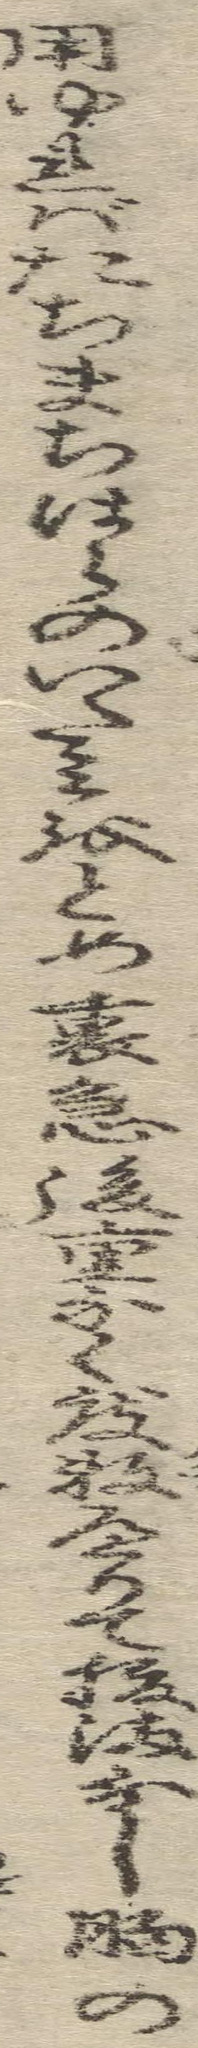用ゆればたちまちはらのいたみをとめ裏急後重なく度数へりて腹満なし胸の
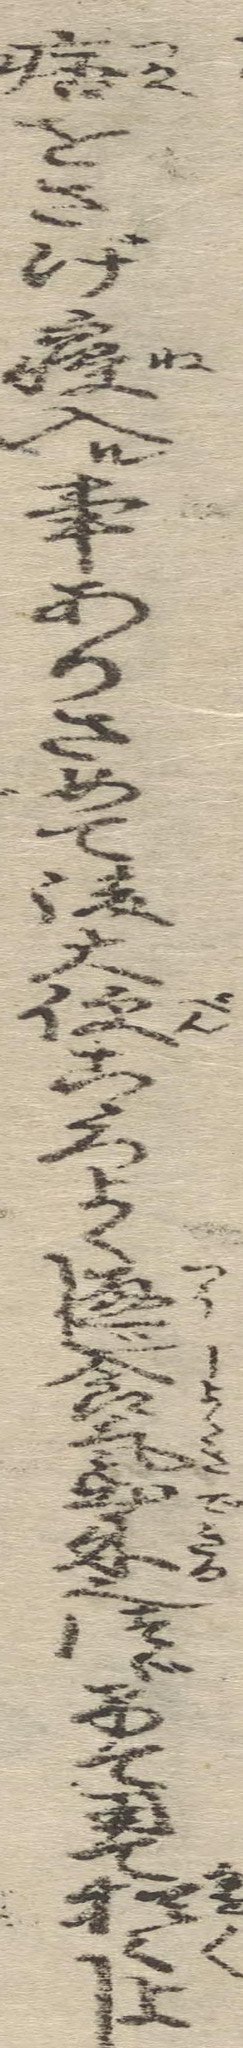痞をさげ寝入る事ありさめて後大便こゝろよく通じ食気出来也つゞけて用て猶々よし
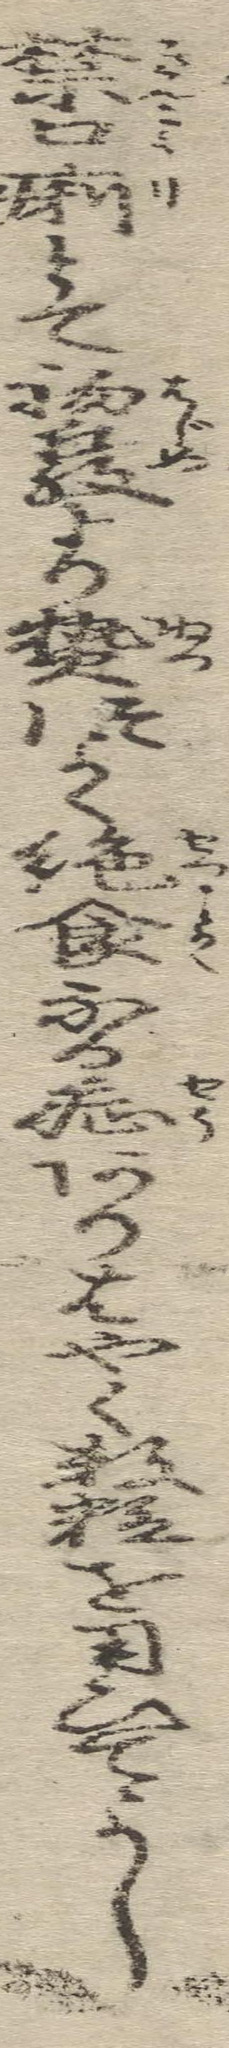一禁口痢とて初発より熱つよく絶食なる症ありはやく数粒を用ひてよし
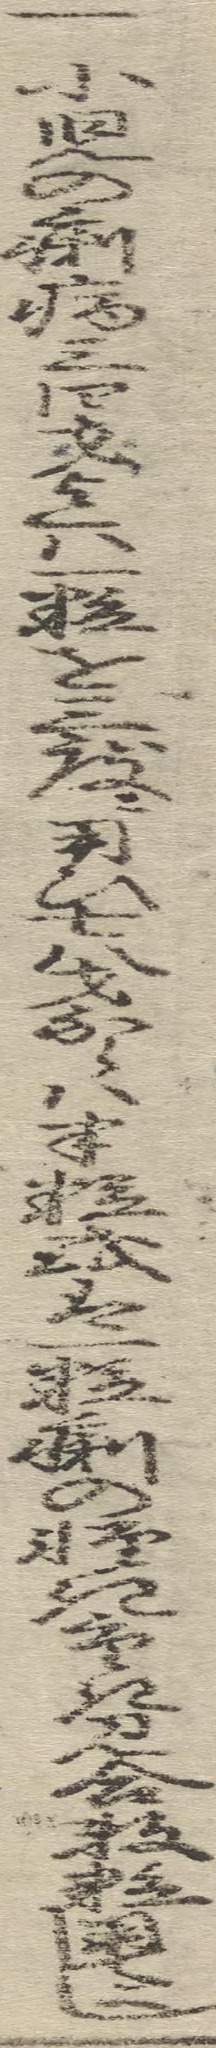一小児の痢病三四才迄は一粒を三度に用ひ七八才ならは半粒或は一粒痢の軽き重き見合数粒用てよし
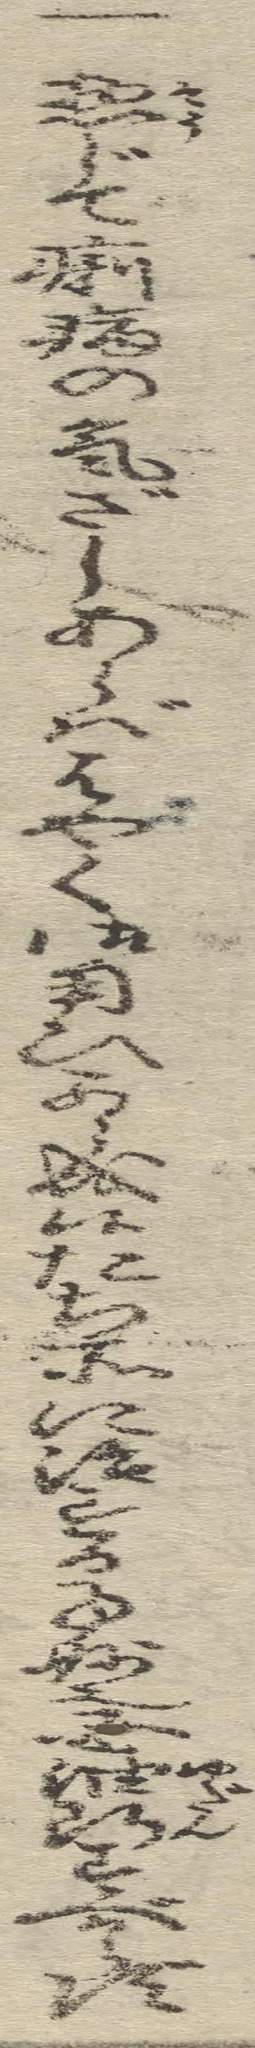一惣じて痢病の気ざしあらばはやく御用ひ可被成候たち所に治する事妙也固油断すべからず
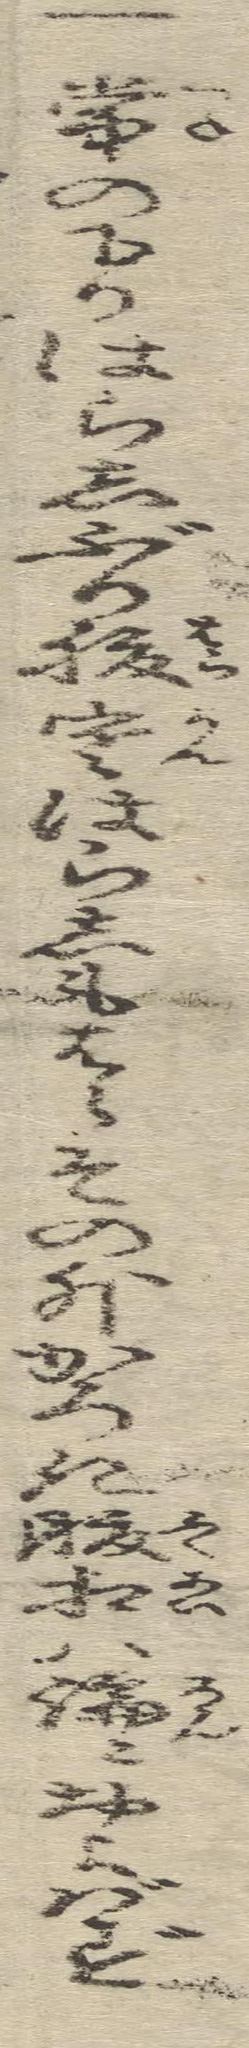一常の下りはらしぶり腹寒はらしもはらその外かろき腹相は論におよばず
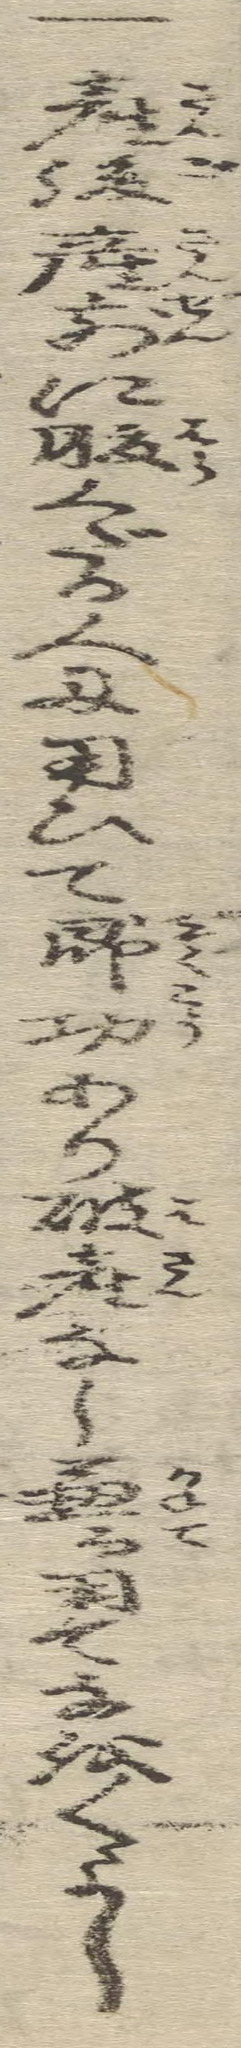一産後産前に腹くだる人に用ひて即功あり破産なし兼而用てなを〳〵よし
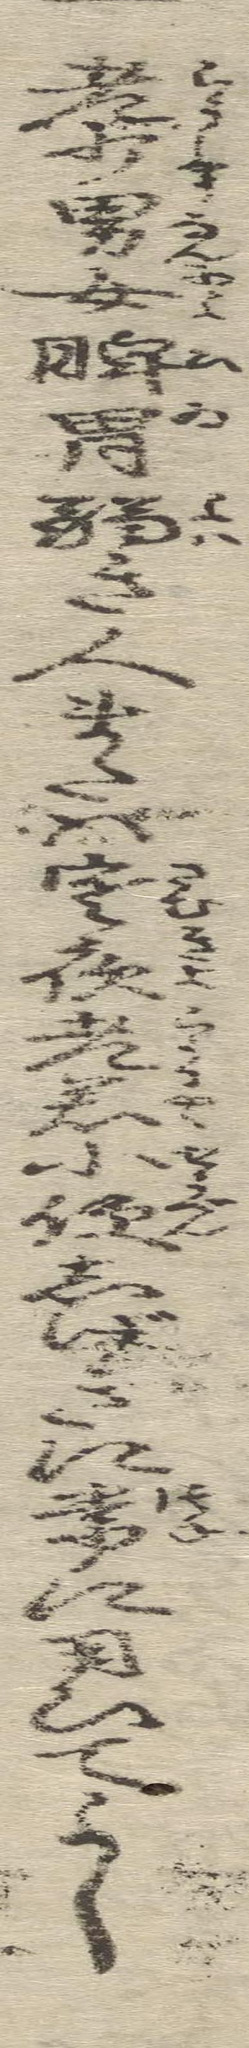一老少男女脾胃弱き人または寒夜老若小便しげきに常に用ひてよし
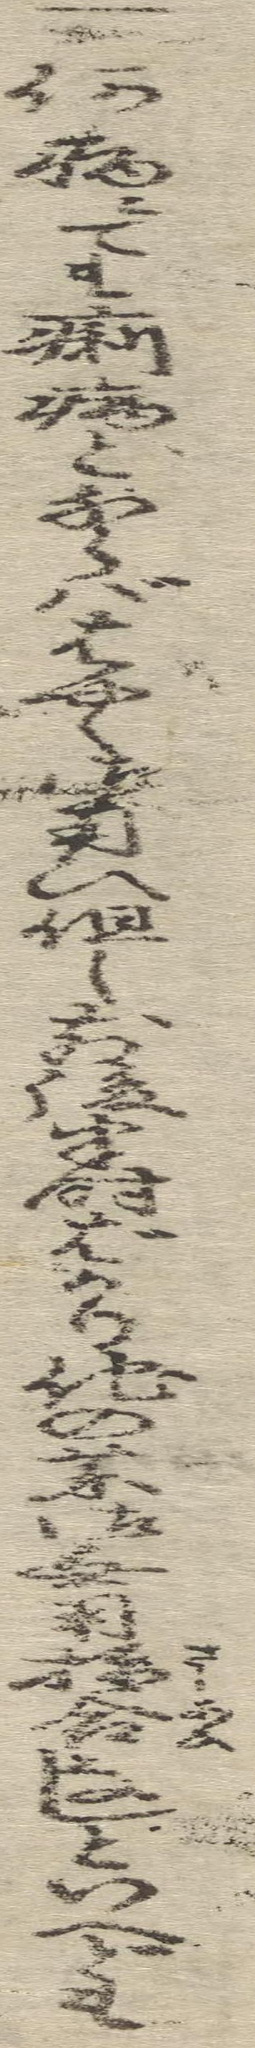一何病にても痢病とならばはやく御用ひ但し前後半時ばかり他の薬御無用指合なしといへども
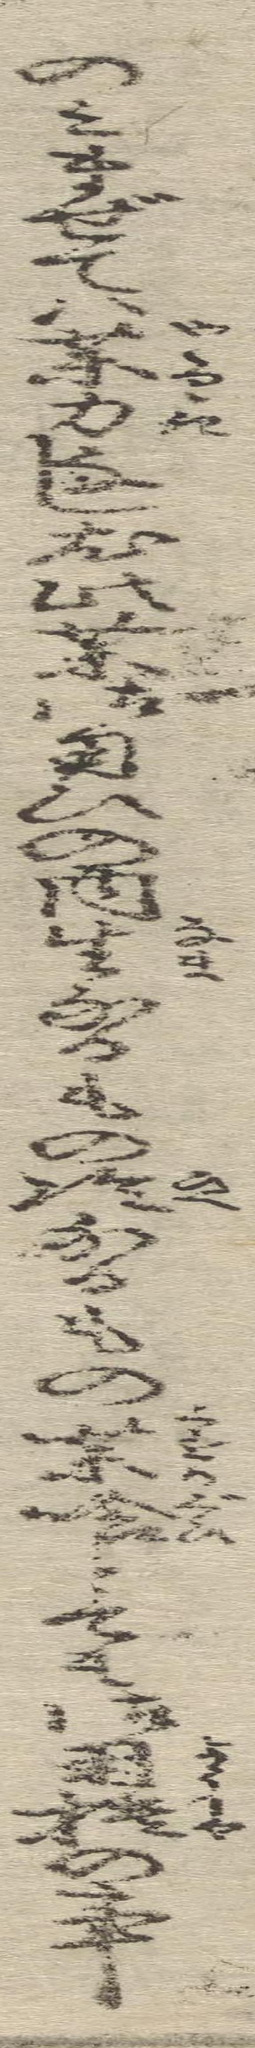のみまぜては薬力なし尤此薬御用ひの内生なるもの冷なるもの薬喰ても御用捨の事
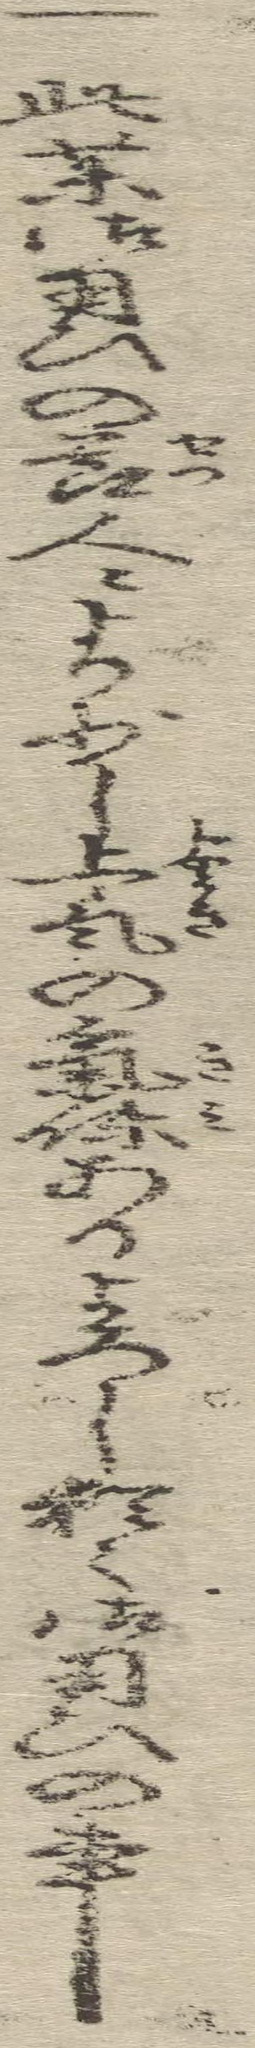一此薬御用ひの節人により少し上気の気味ありよろし猶々御用ひの事
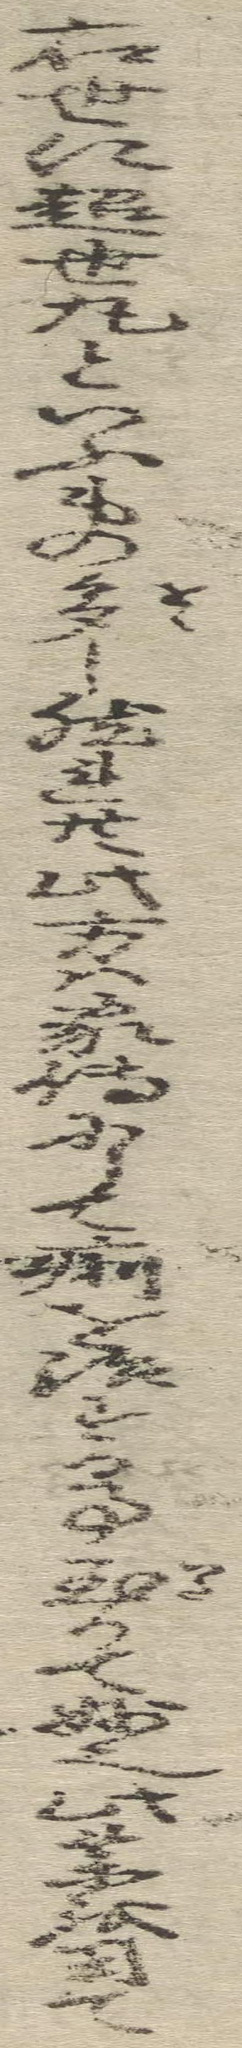右世に超世丸といふもの多し然れ共此方は家伝にして痢を治する事至りて妙也此薬を用て
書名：浪華薬種問屋能書張交帖. 一
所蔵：国立国会図書館 National Diet Library, JAPAN
